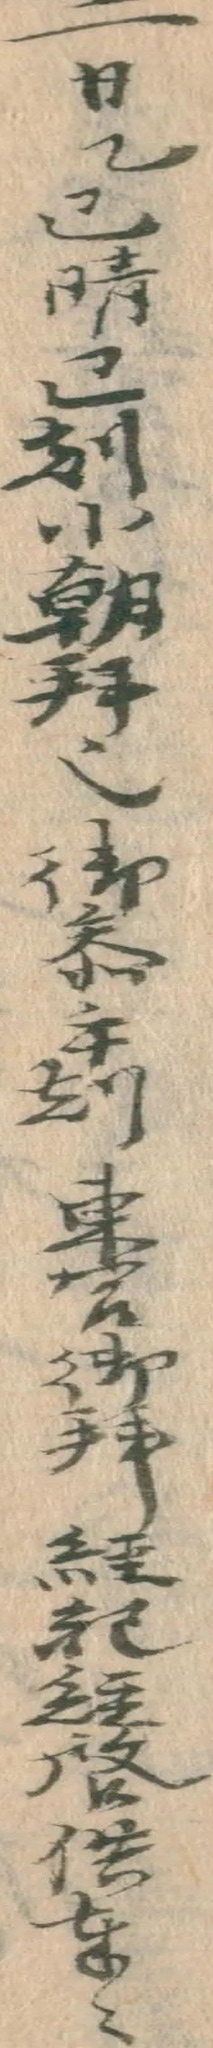二日乙巳晴巳刻小朝拝也御参午刻東宮御拝経紀経啓供奉之
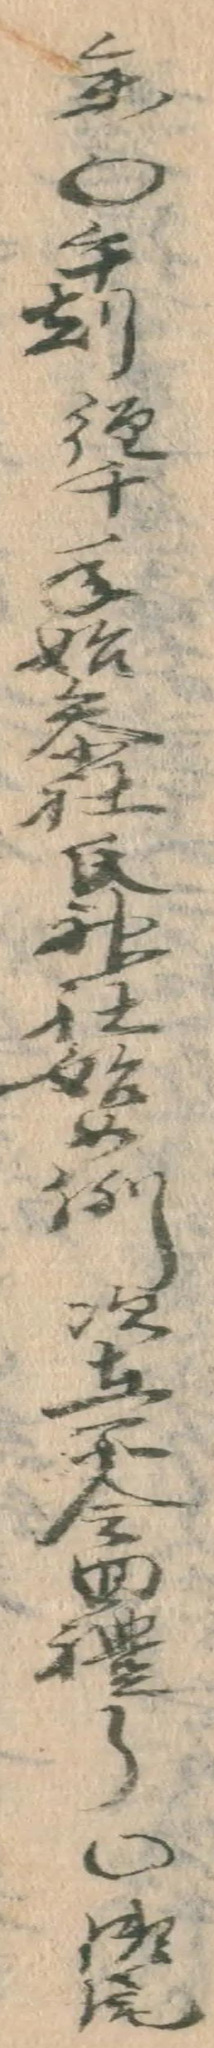参〇午刻経千年始参社氏神社始如例次在所令回禮了〇瀬尾
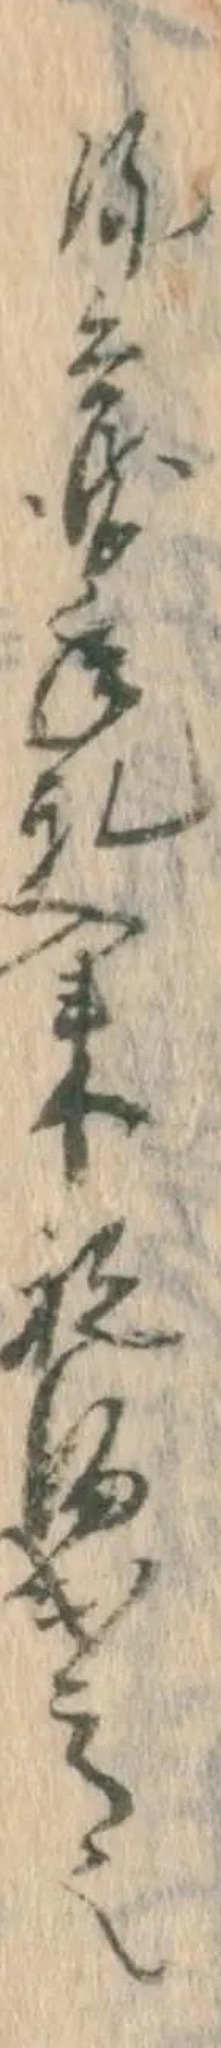弥兵衛年礼入来祝酒出之也
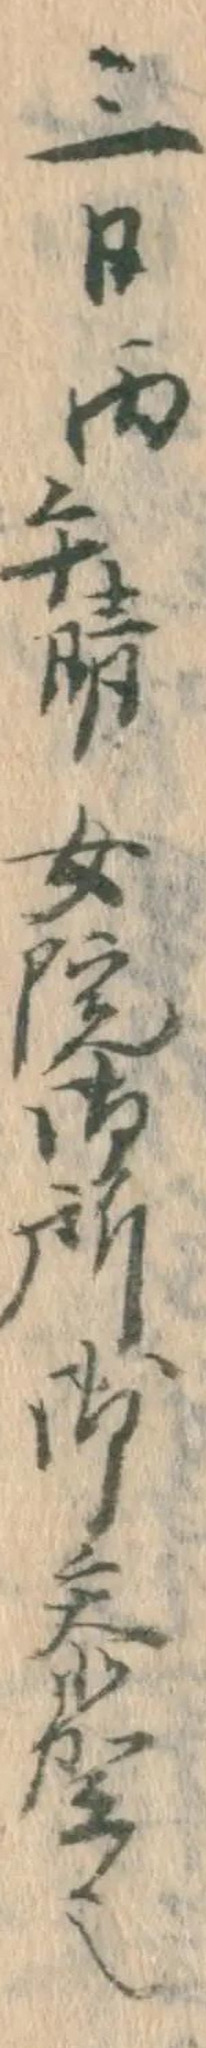三日丙午晴女院御所御参賀也
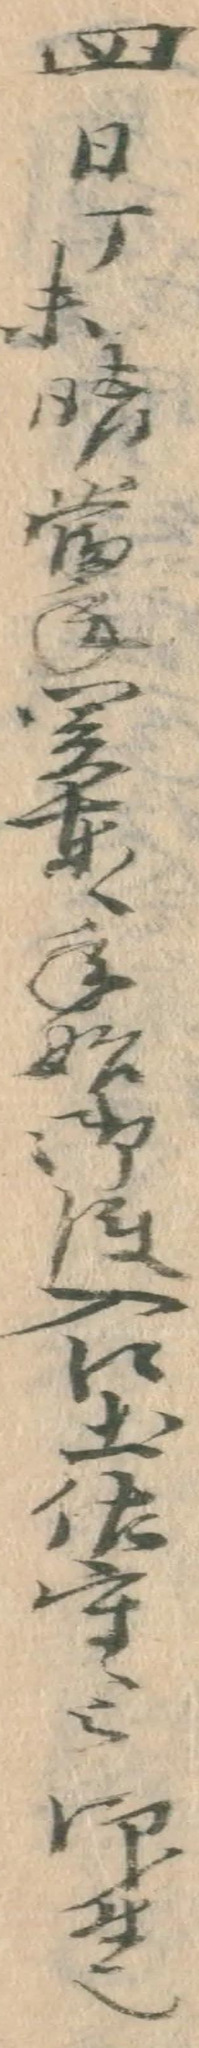四日丁未晴當年関東へ年始御使入江土佐守へ被仰付也
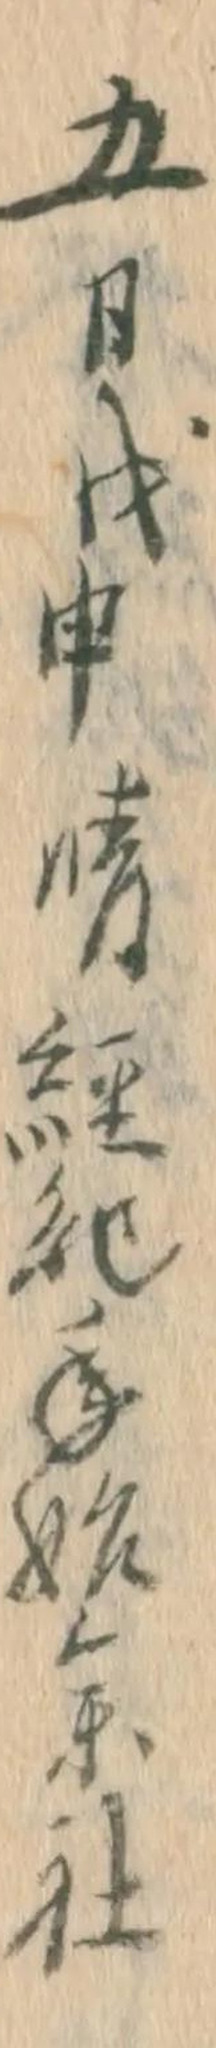五日戊申晴経紀年始参社
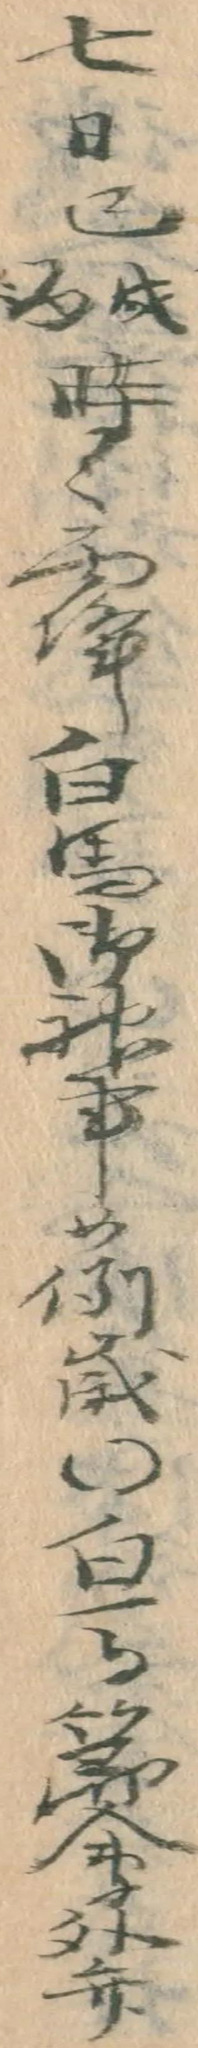七日己戌時々雨降白馬御神事如例歳○白馬節會外弁

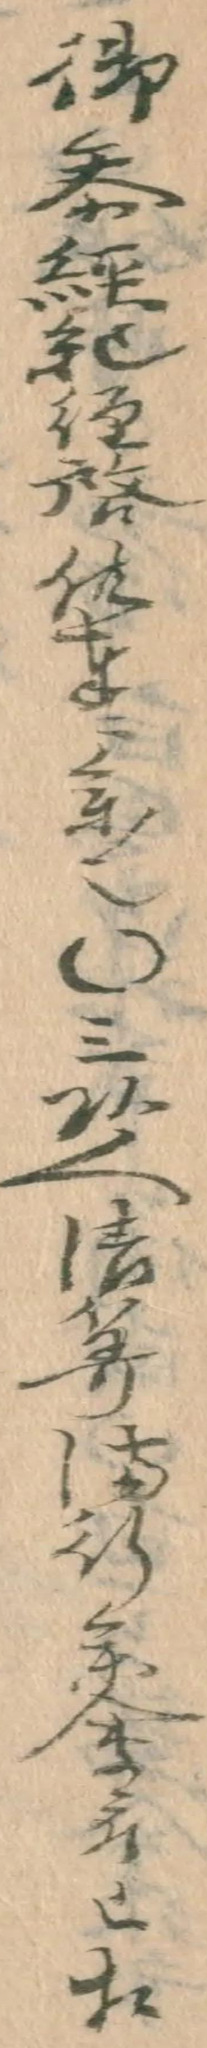御参経紀経啓供奉ニ而参也○三頭人清算満行参會ニ付被相
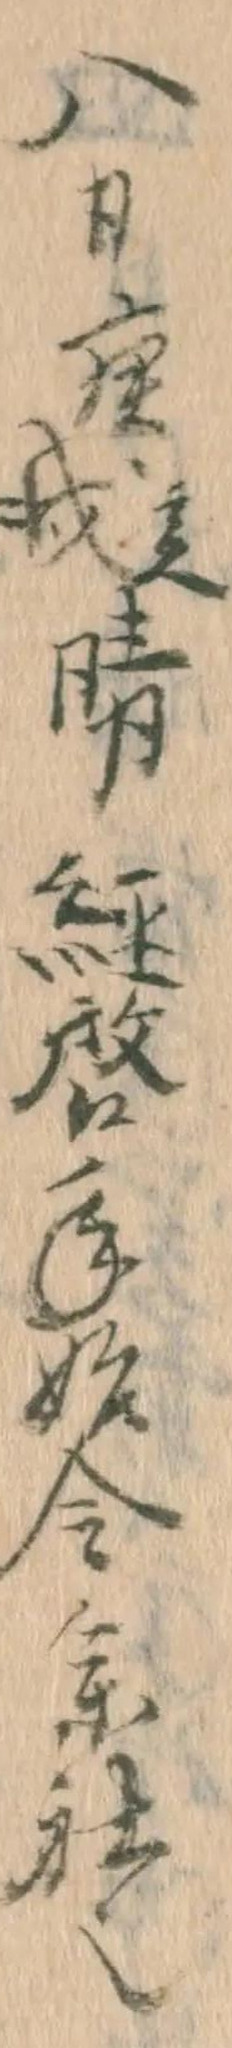八日庚亥晴経啓年始令参社之
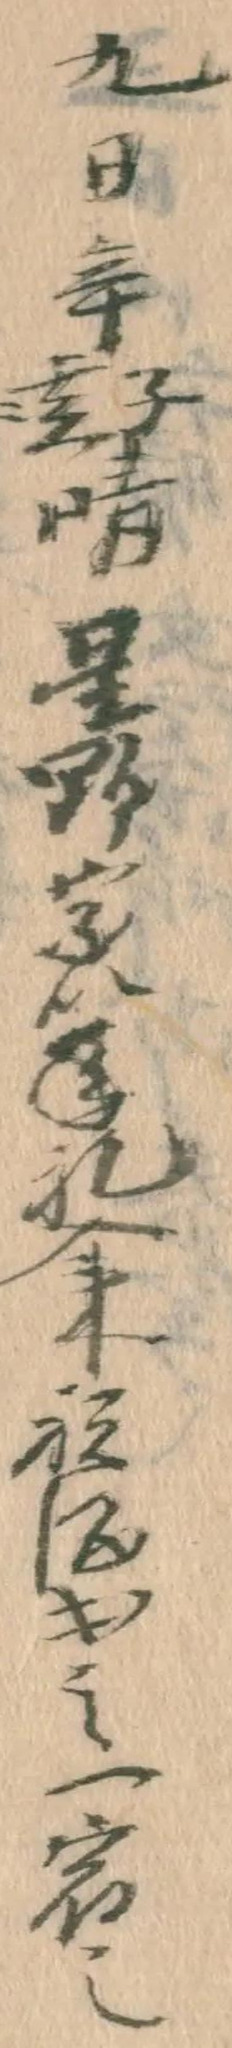九日辛子朝晴星野家以年礼入来祝酒出之一宿也
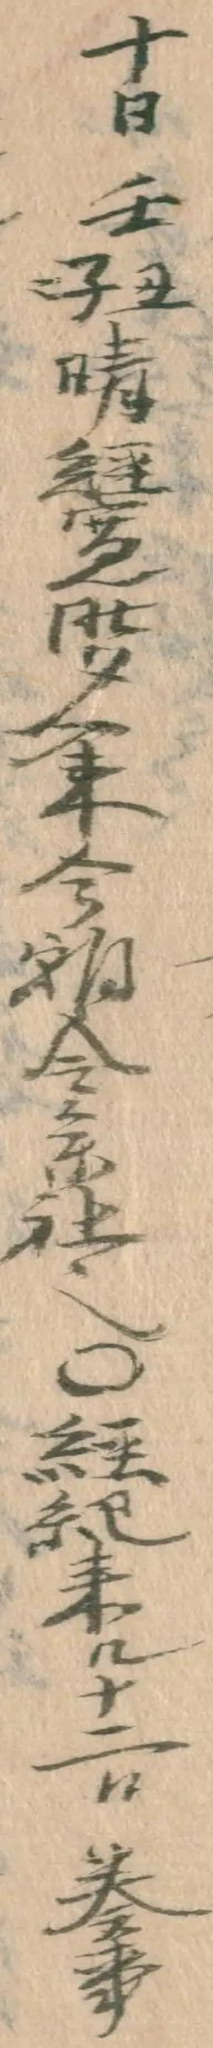十日壬丑晴経寛昨夕人来今朝令参社也○経紀来ル十二日奏事
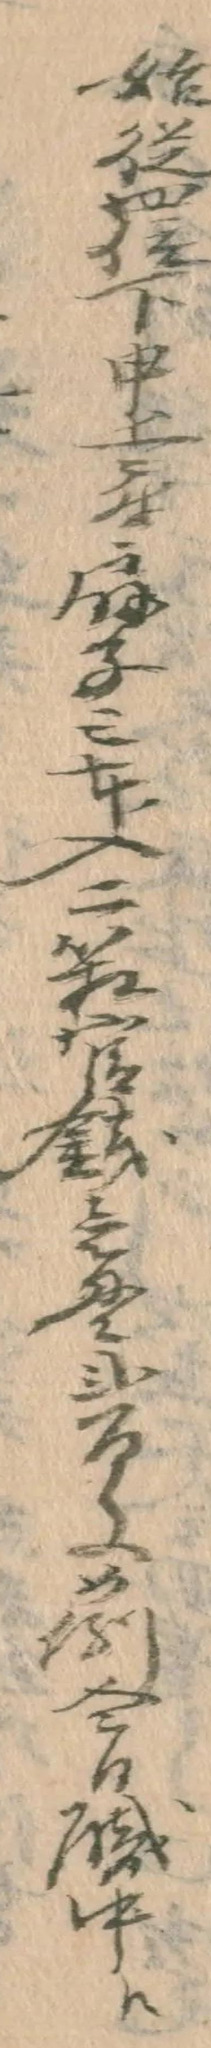始従四位下申上ニ付扇子三本入二箱官銭壱貫弐百文如例今日職中え
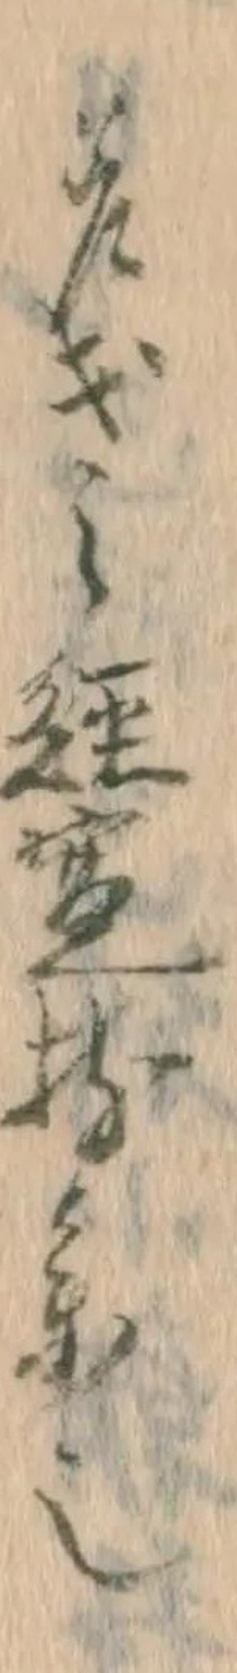差出也経寛持参也
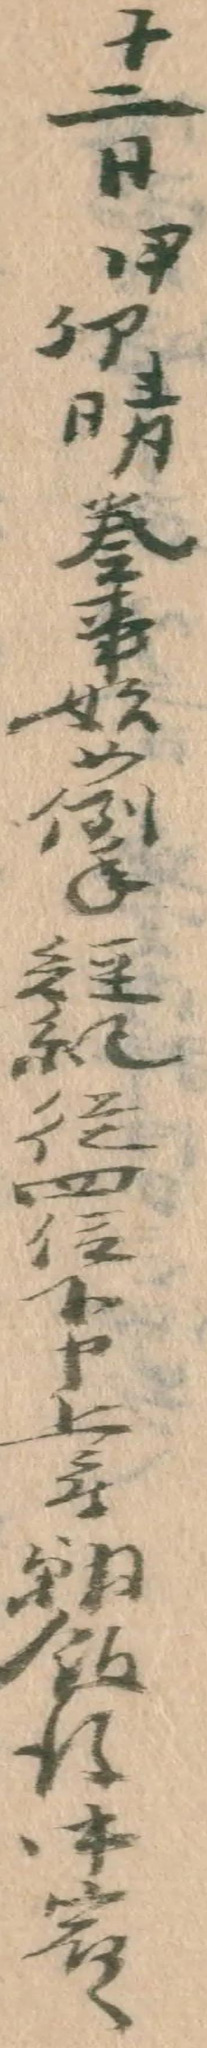十二日甲卯晴奏事始如例年経紀従四位下申上ニ付朝飯後中宿へ
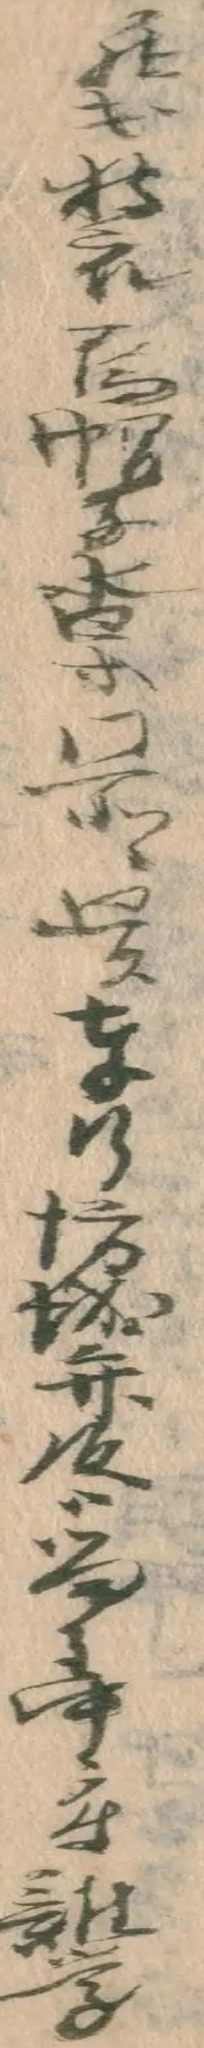罷出狩衣烏帽子沓等同所に廻ス奉行坊城弁殿御留守中ニ付雑学
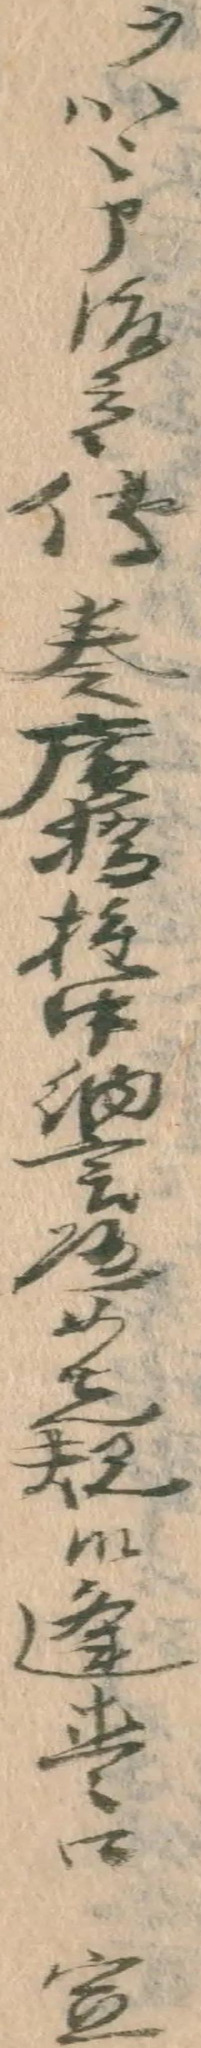ヲ以被申渡云々傳奏廣橋権中納言殿如先規御逢直々口宣
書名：賀茂社記録. 第69冊
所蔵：国立国会図書館 National Diet Library, JAPAN
